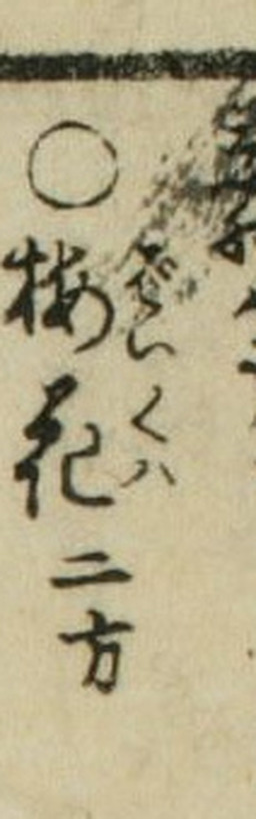○梅花二方
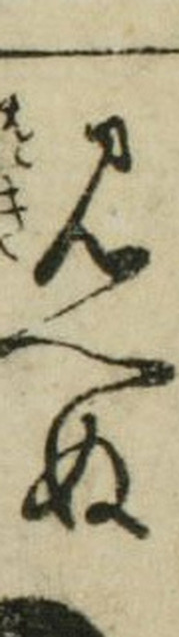見へぬ
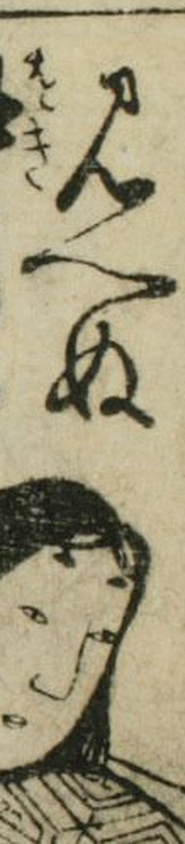見へぬ
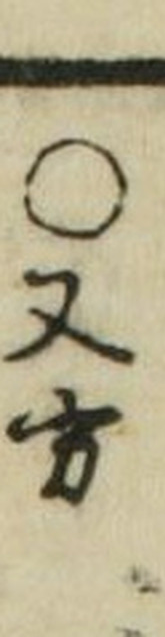○又方
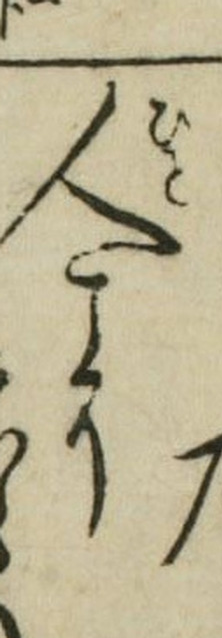人こそ
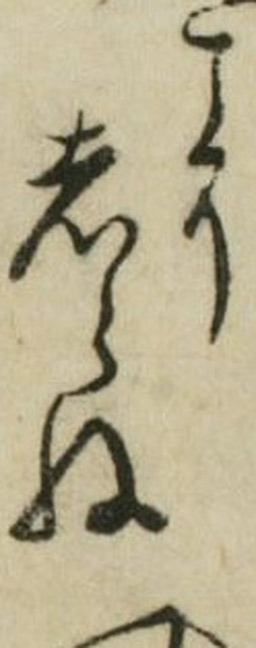しらね
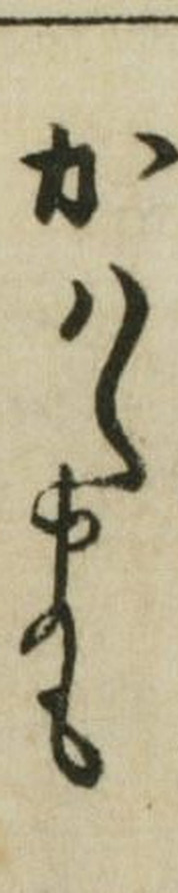かはくまも
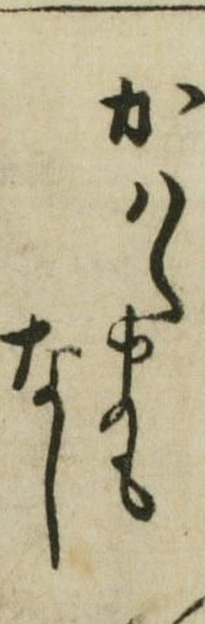かはくまも
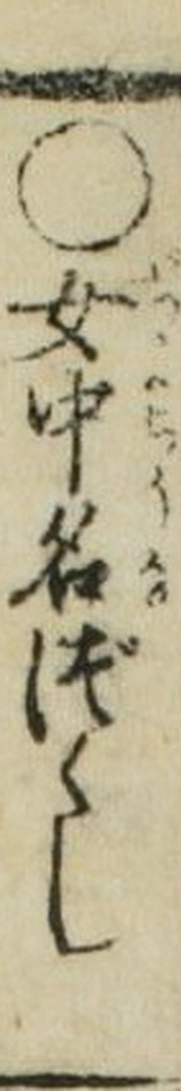○女中名づくし
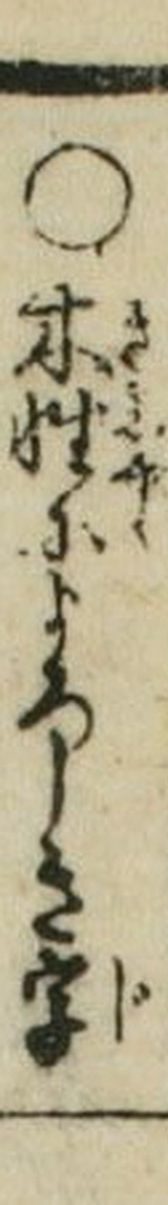○木性によろしき字
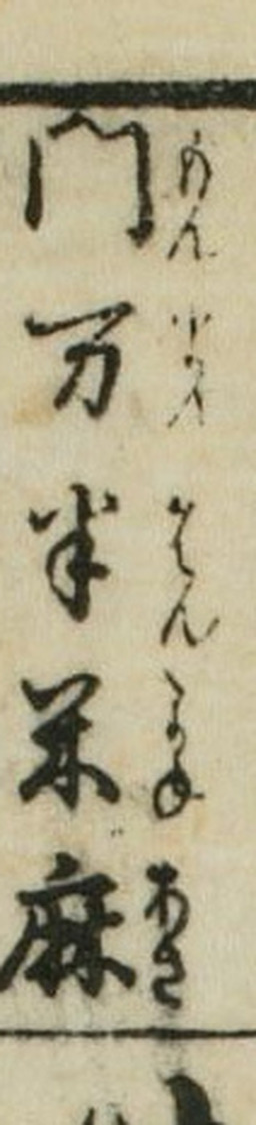門万半米麻
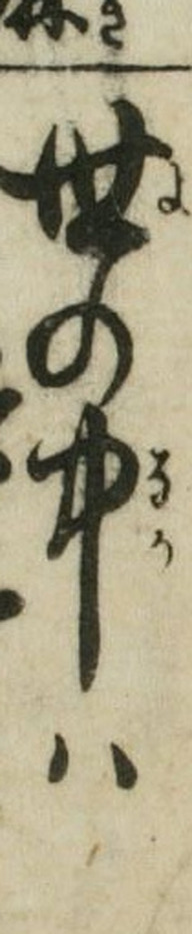世の中は
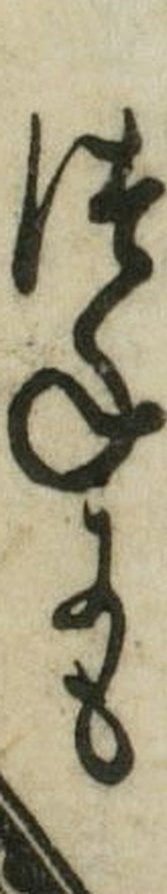つねにも
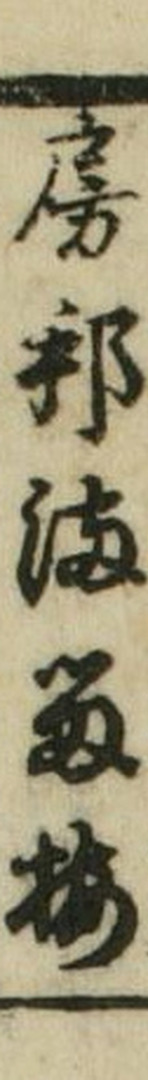房邦満留梅
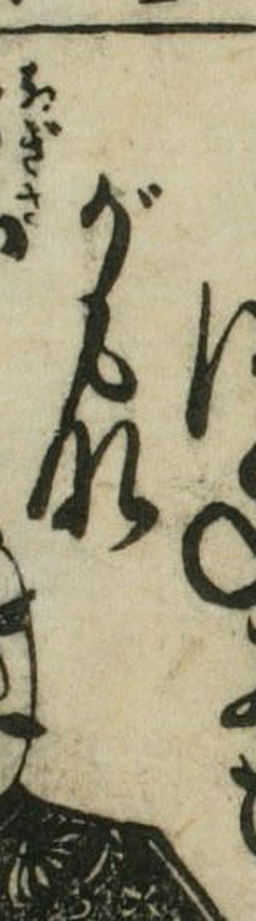がもな
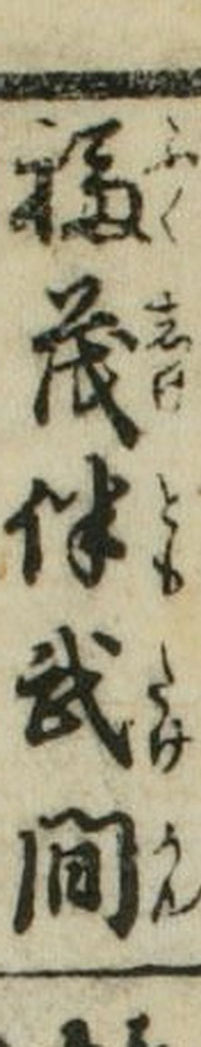福茂伴武間
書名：百人一首
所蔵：東京学芸大学教育コンテンツアーカイブ
